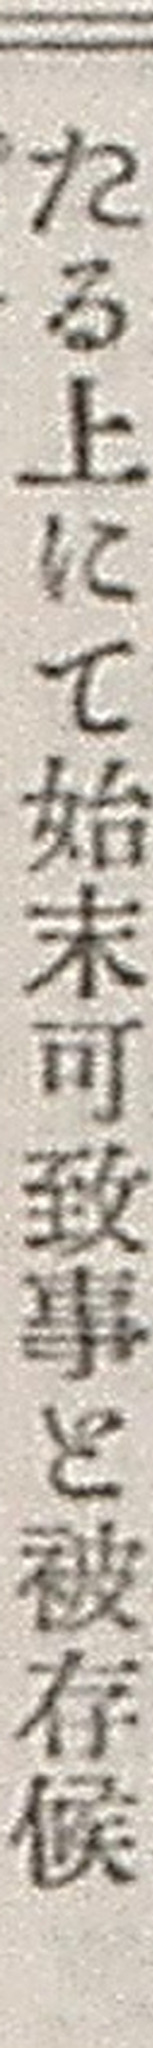たる上にて始末可致事と被存候
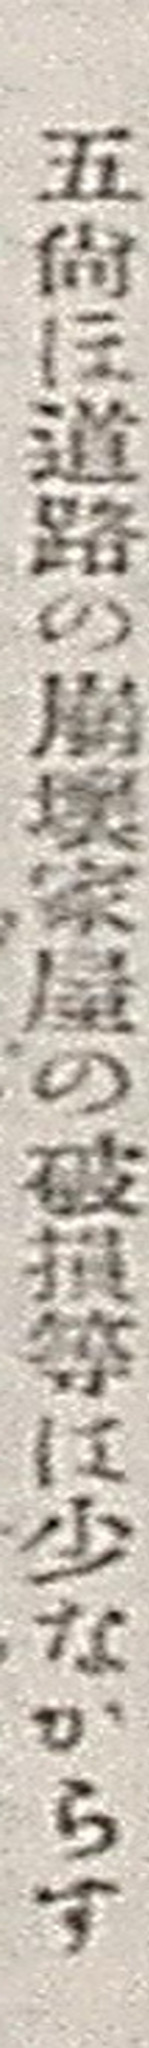五尚ほ道路の崩壊家屋の破損等少なからず
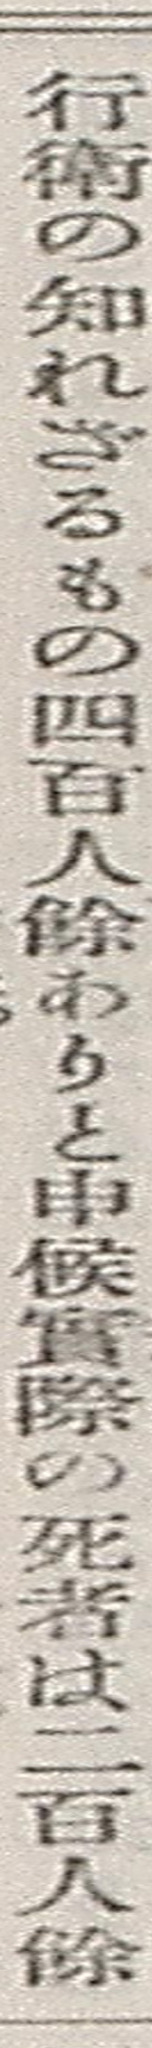行衛の知れざるもの四百人餘ありと申候実際の死者は二百人餘
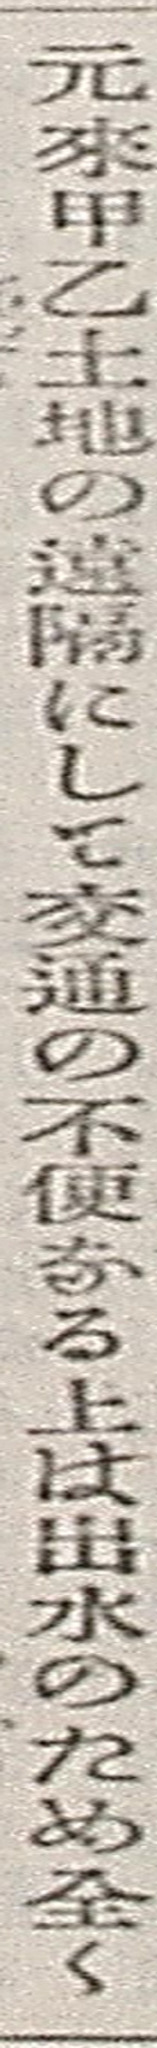元来甲乙土地の遠隔にして交通の不便なる上は出水のため全く
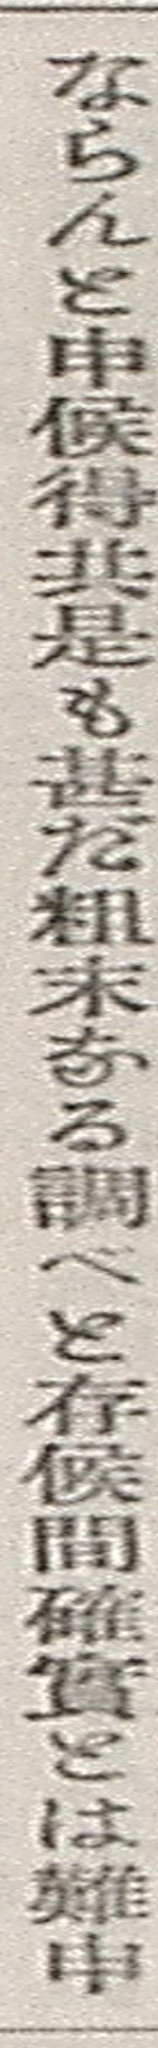ならんと申候得共是も甚だ粗末なる調へと存候間確実とは難申
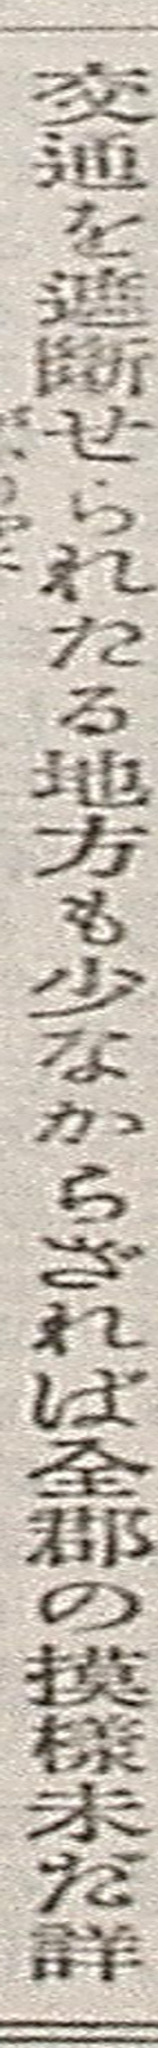交通を遮断せられたる地方も少なからざれば全部の模様未だ詳
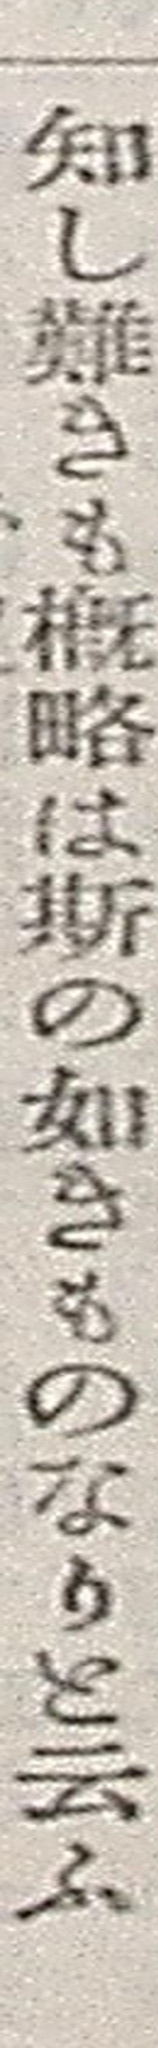知し難きも概略は斯の如きものなりと云ふ
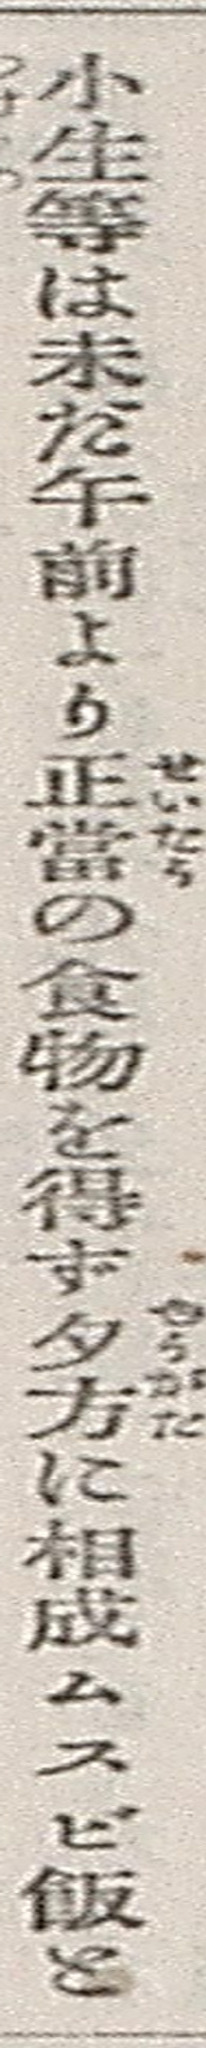小生等は未だ午前より正当の食物を得ず夕方に相成ムスビ飯と
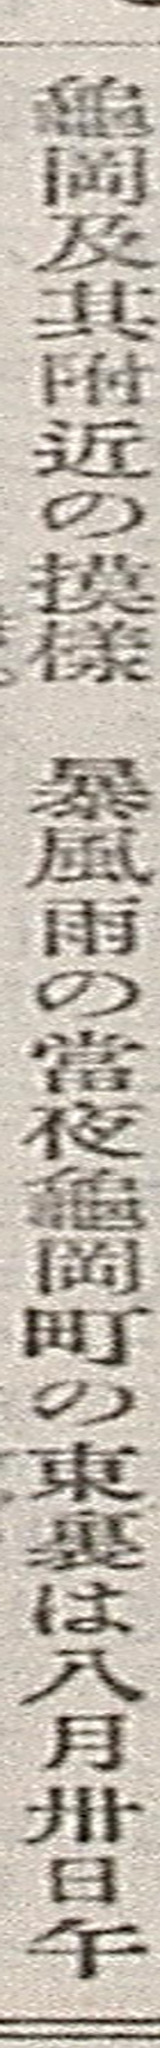亀岡及其附近の模様暴風雨の当夜亀岡町の東裏は八月卅日午
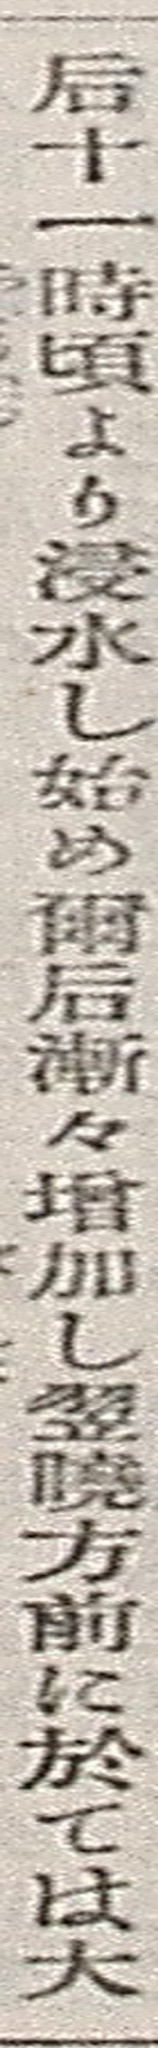後十一時頃より浸水し始め爾後漸々増加し翌暁方前に於ては大
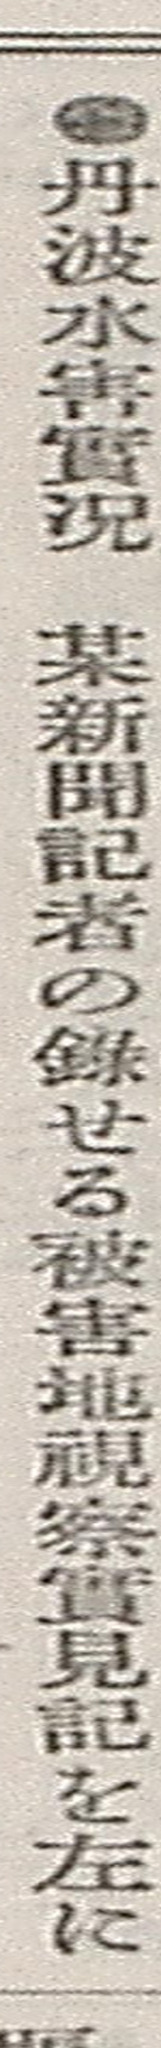●丹波水害実況某新聞記者の録せる被害地視察実見記を左に
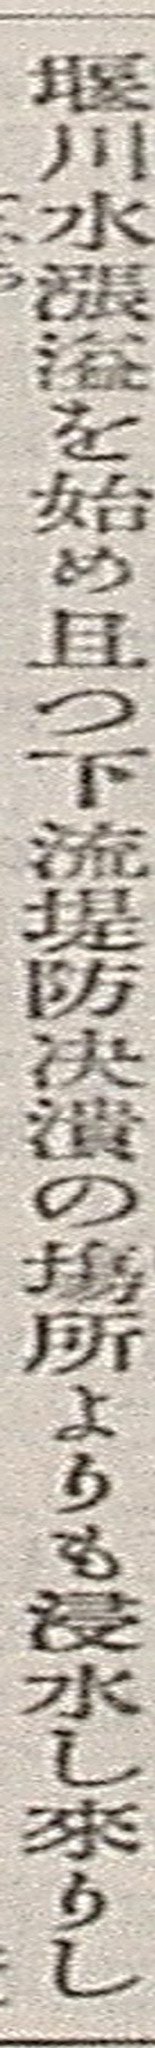堰川水漲溢を始め且つ下流堤防决潰の場所より浸水し来りし
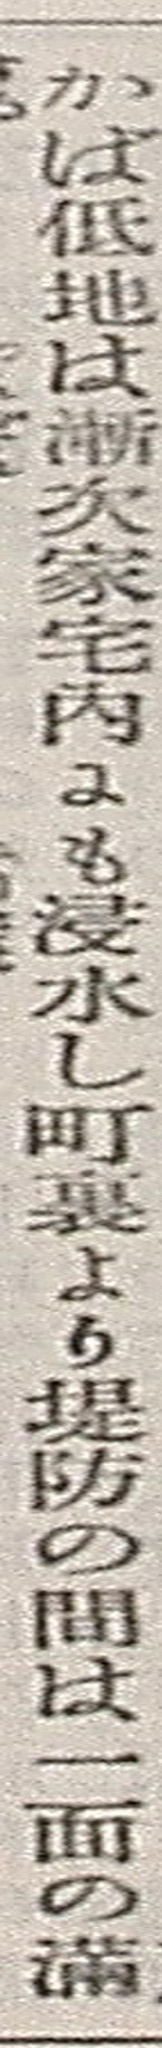かば低地は漸次家宅内にも浸水し町裏より堤防の間は一面の万
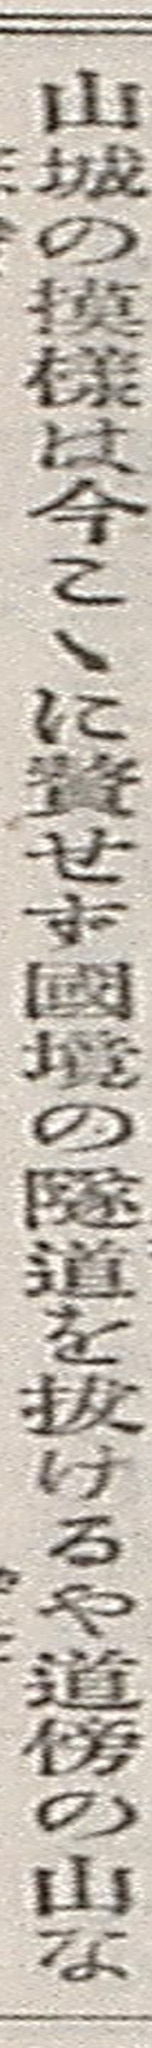山城の模様は今こゝに贅せず国境の隧道を抜けるや道傍の山な
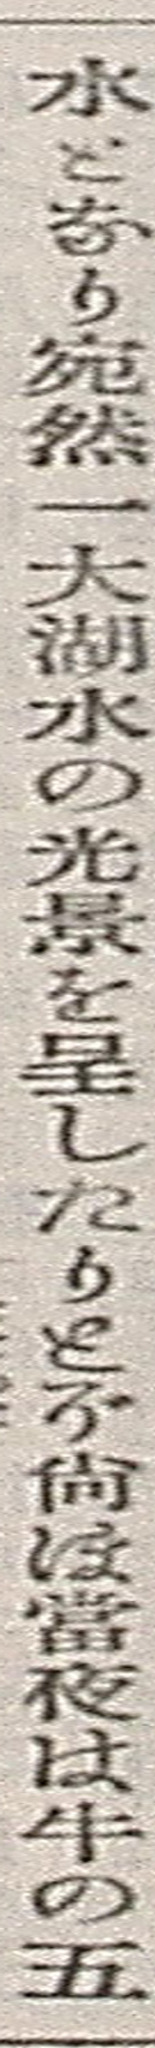水となり宛然一大湖水の光景を呈したりとそ尚ほ当夜は牛の五
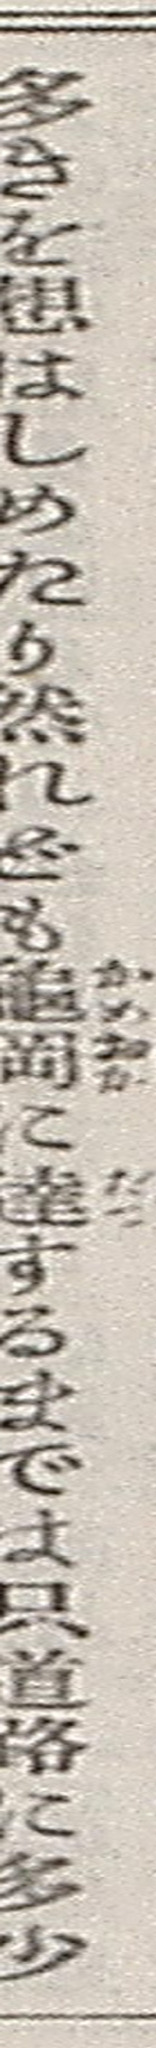多きを想はしめたり然れども亀岡に達するまでは只道路に多少
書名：風俗畫報臨時増刊第百二十六號　洪水被害録（中）
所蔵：東京大学地震研究所図書室 Earthquake Research Institute Library, The University of Tokyo, JAPAN
